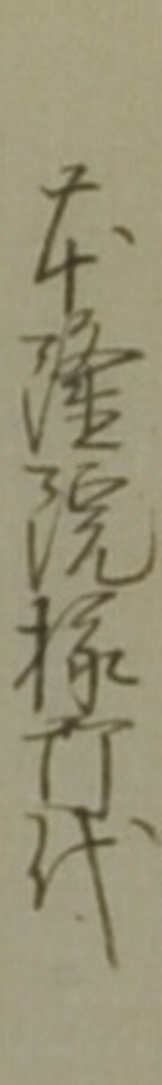本隆院様御代
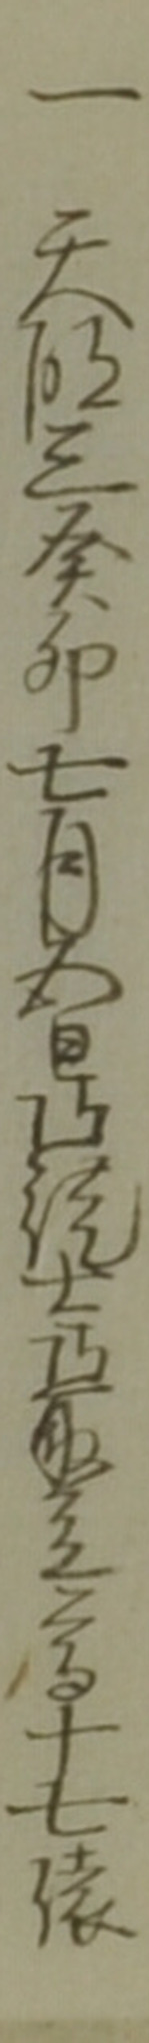一天明三癸卯七月五日御徒士御取立高十七俵
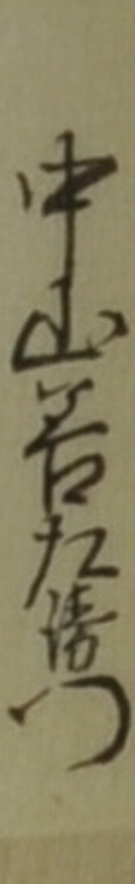中山善左衛門

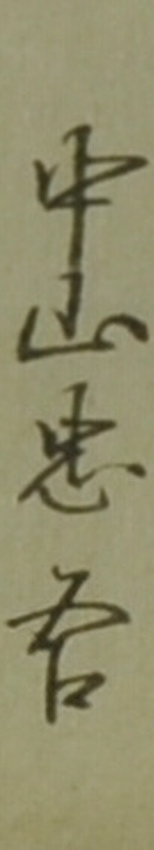中山忠吾
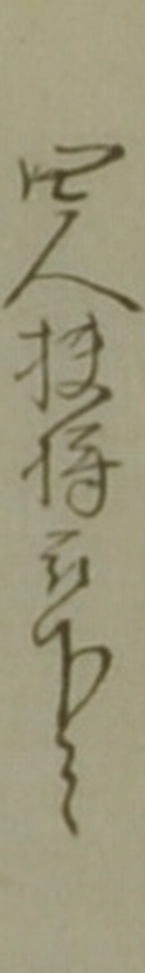四人扶持被下之

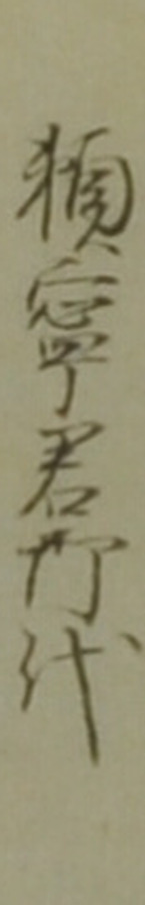頼寧君御代
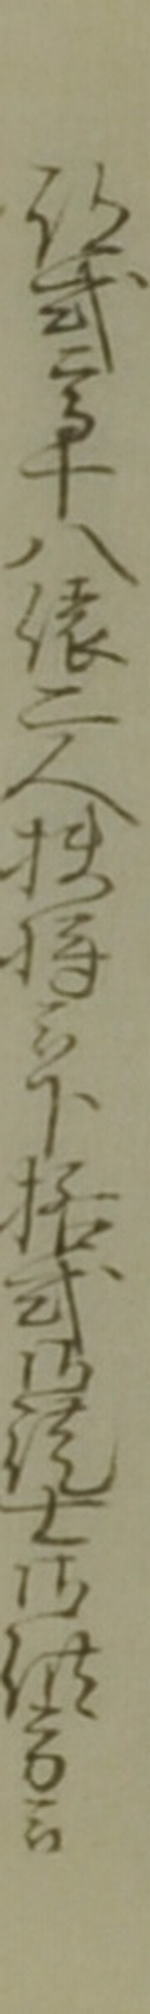跡式高十八俵二人扶持被下格式御徒士御供方被
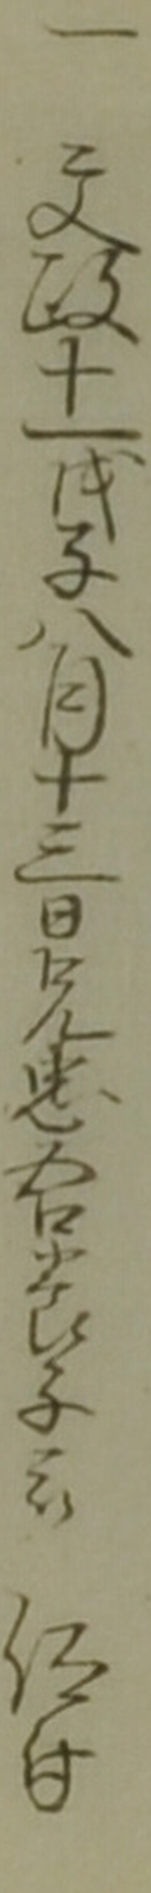一文政十一戌子八月十三日兄忠吾養子被仰付
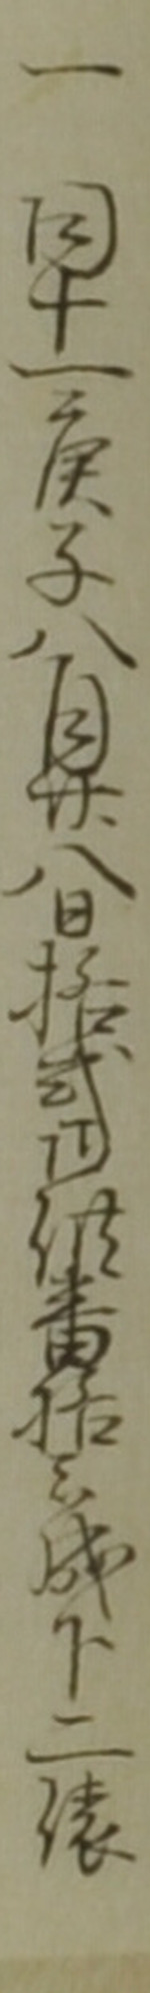一同十一庚子八月廿八日格式御供番格被成下二俵
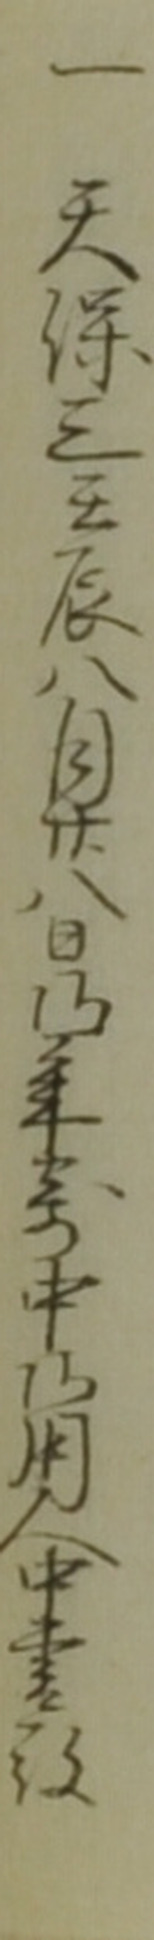一天保三壬辰八月廿八日御年寄中御用人中書役
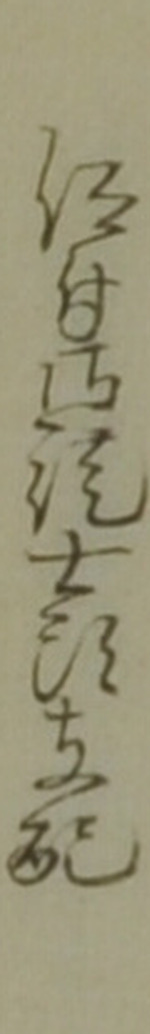仰付御徒士頭支配

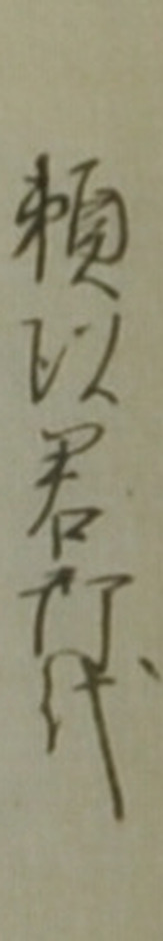頼以君御代
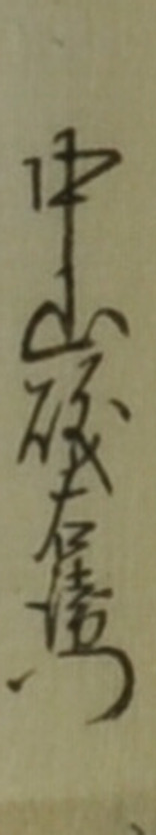中山磯右衛門
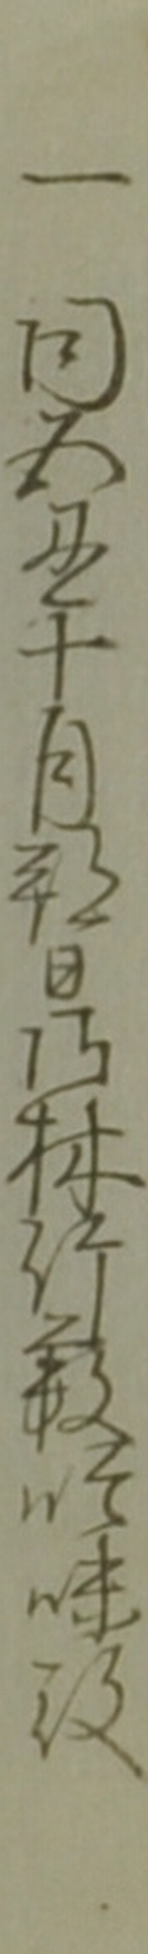一同五丑十月朔日御林竹藪吟味役
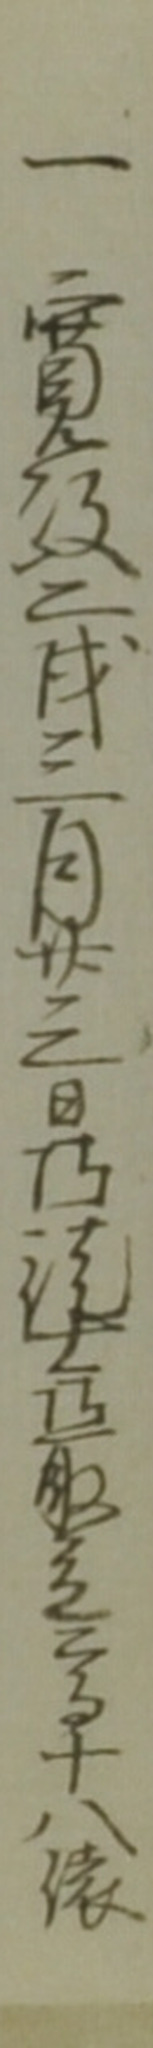一寛政二戌三月廿三日御徒士御取立高十八俵
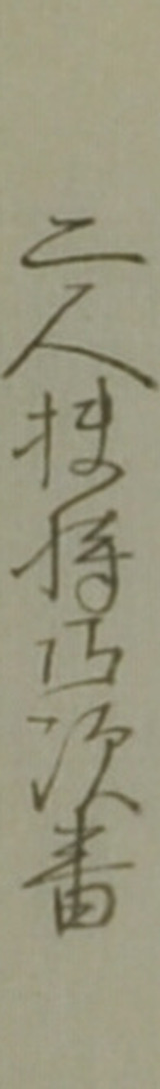二人扶持御次番
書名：無足諸士勤仕録（三）
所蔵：伊那市立高遠町図書館・合同会社AMANE
